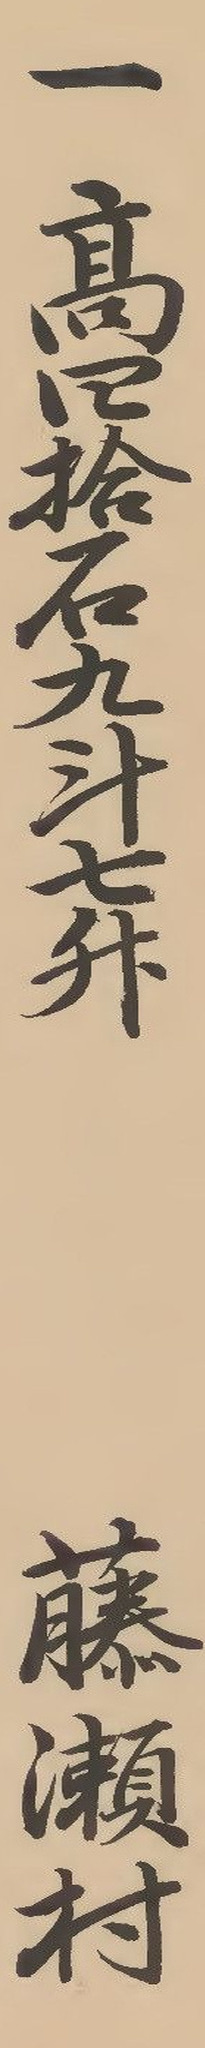一高四拾石九斗七升藤瀬村
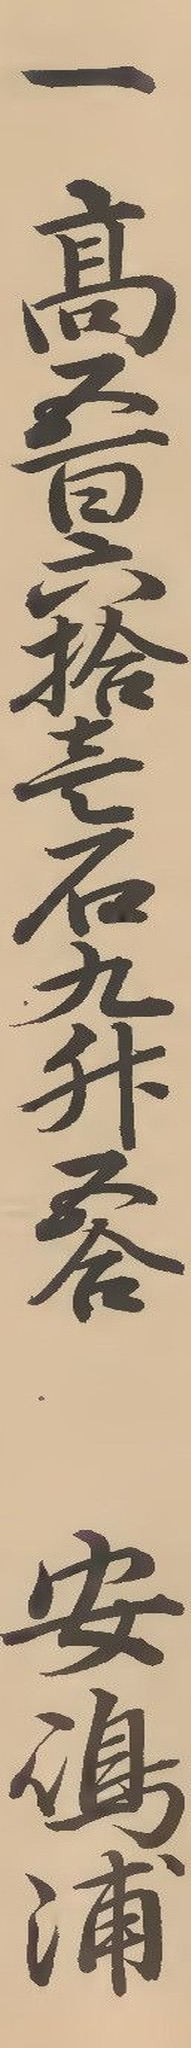一高五百六拾壱石九升五合安島浦
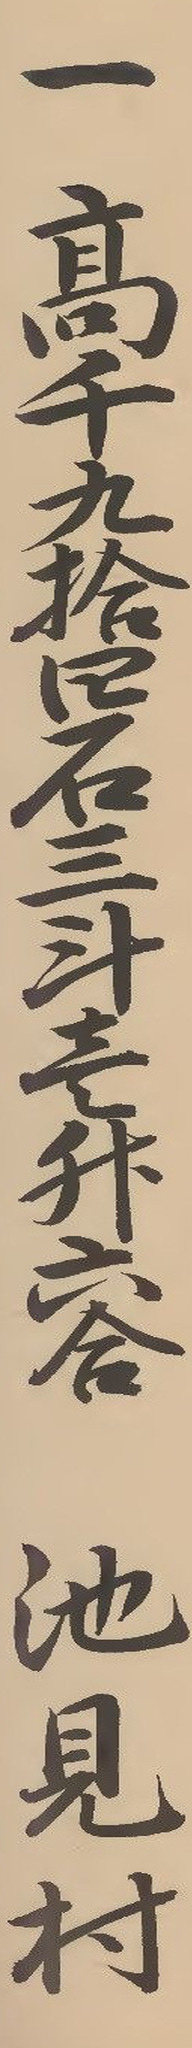一高千九拾四石三斗壱升六合池見村
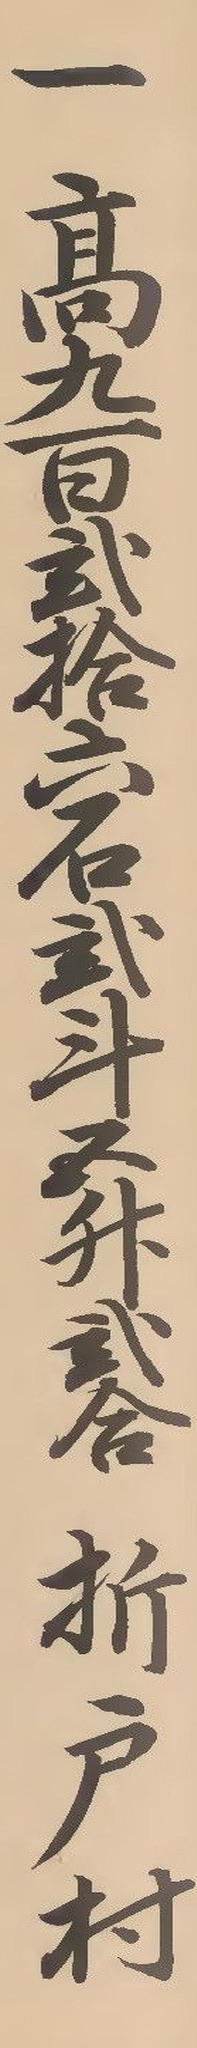一高九百弐拾六石弐斗五升弐合折戸村
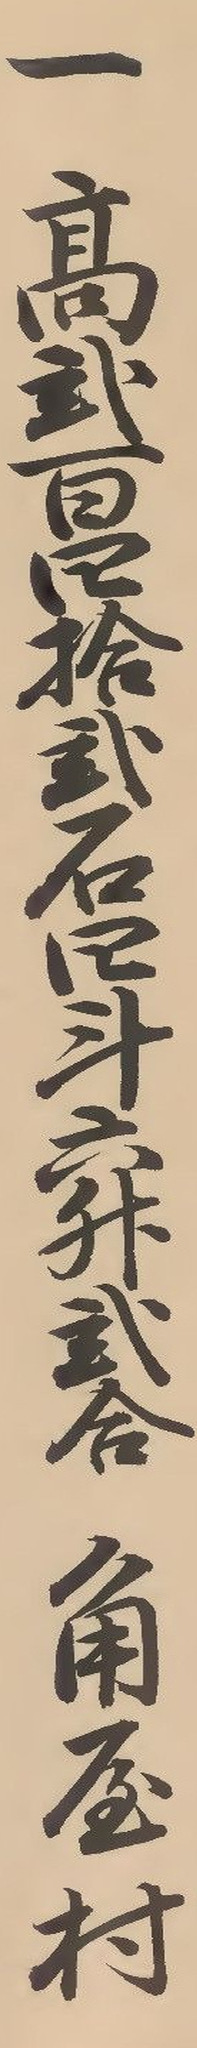一高弐百四拾弐石四斗六升弐合角屋村
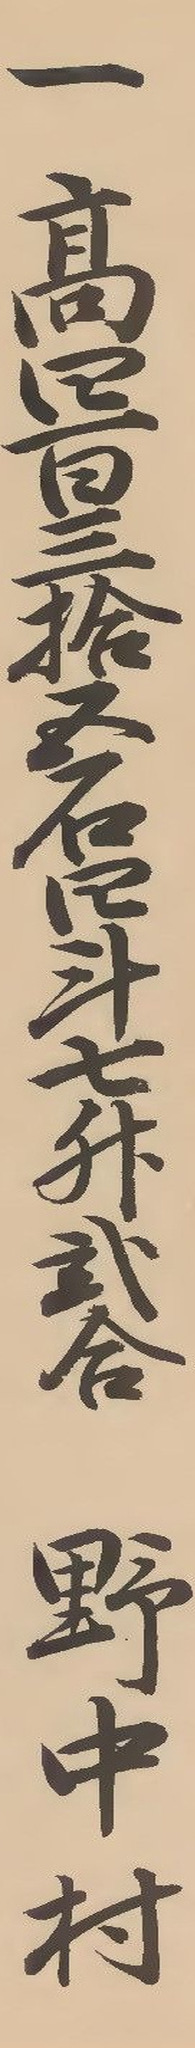一高四百三拾五石四斗七升弐合野中村
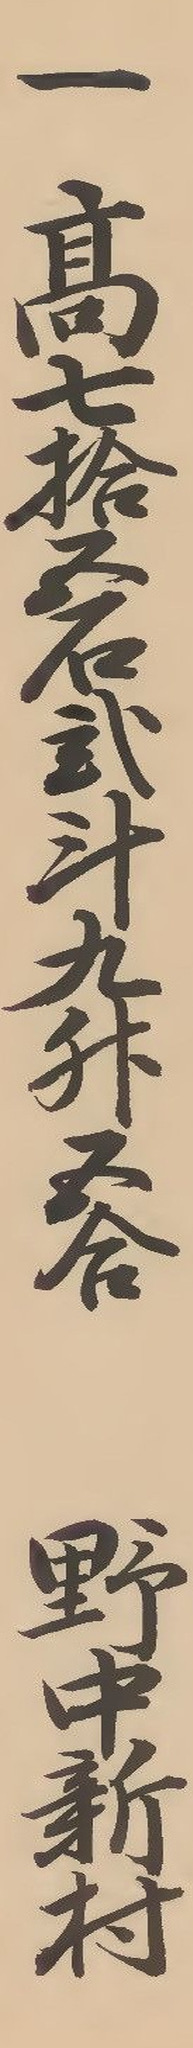一高七拾五石弐斗九升五合野中新村

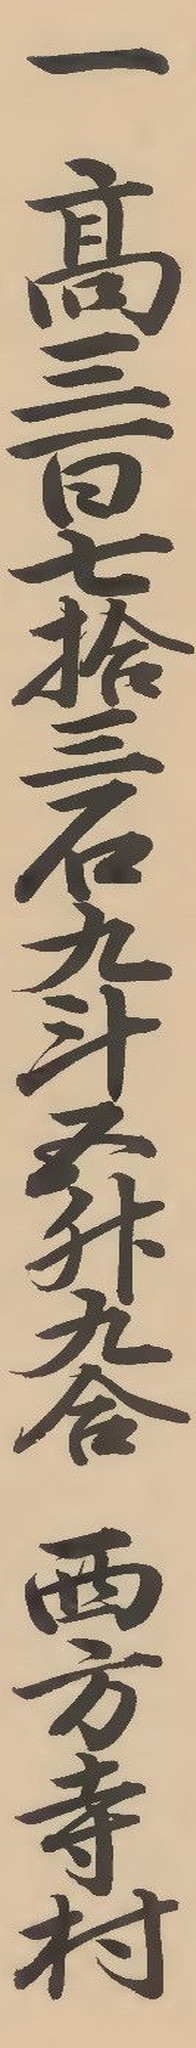一高三百七拾三石九斗五升九合西方寺村
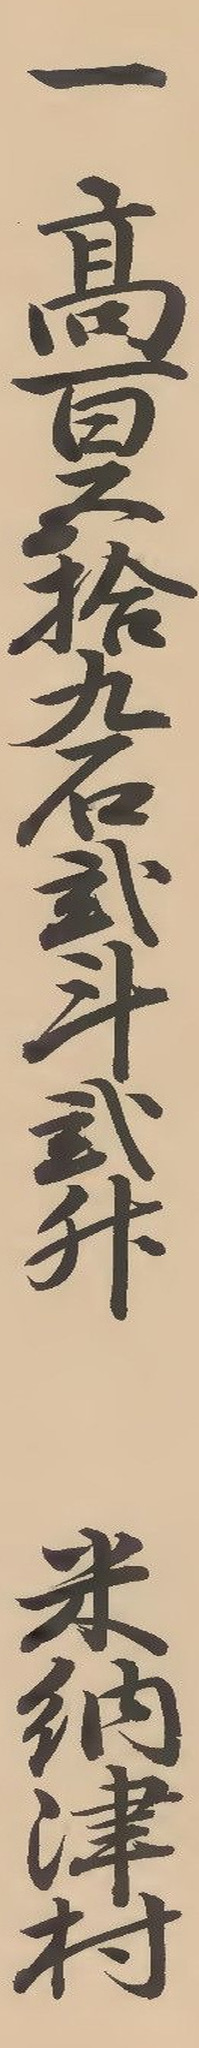一高百五拾九石弐斗弐升米納津村
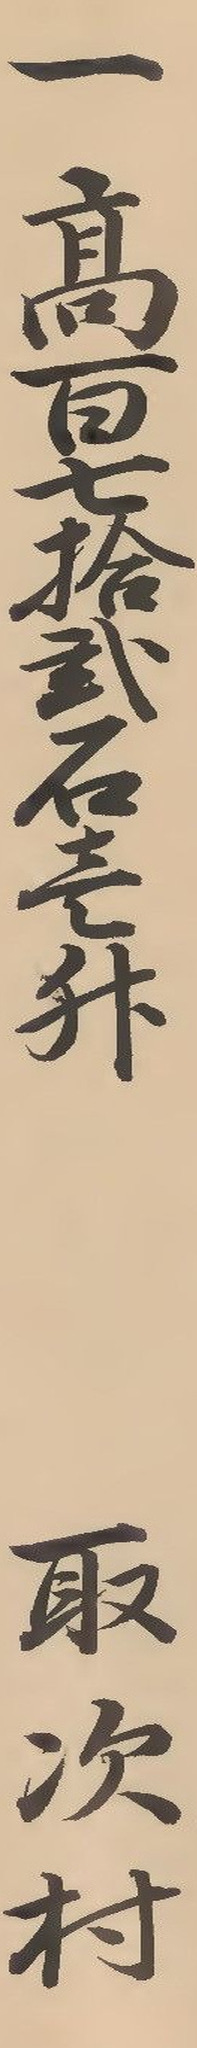一高百七拾弐石壱升取次村
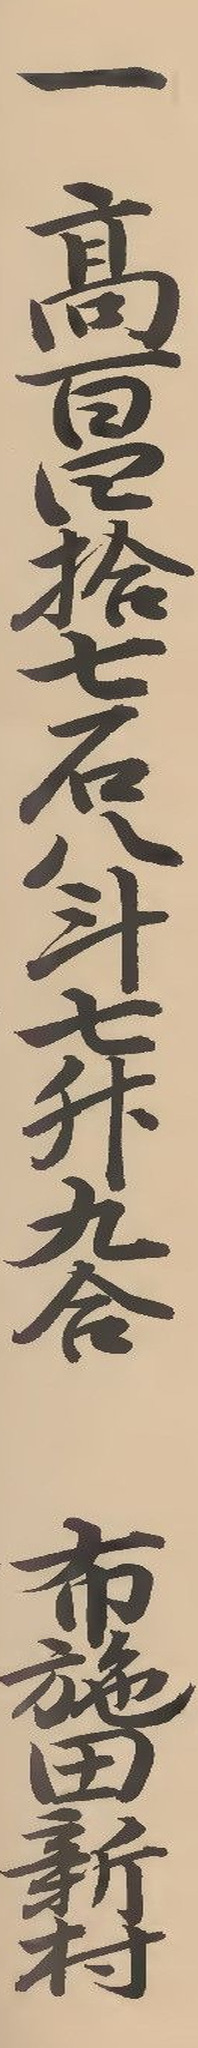一高百四拾七石八斗七升九合布施田新村
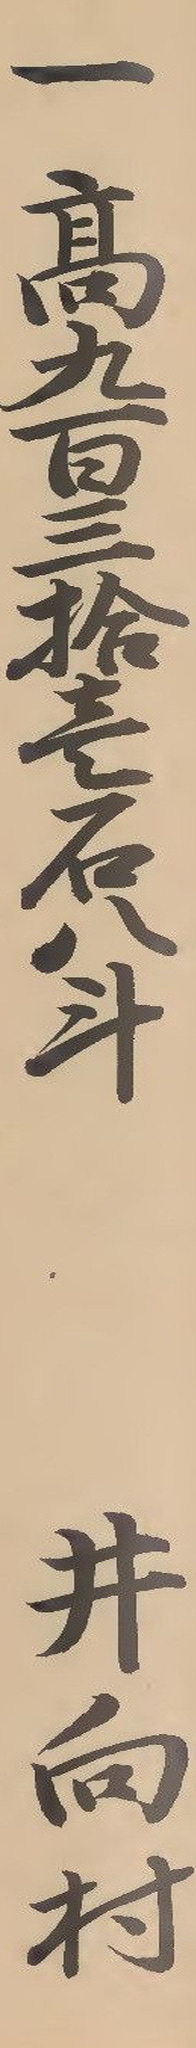一高九百三拾壱石八斗井向村
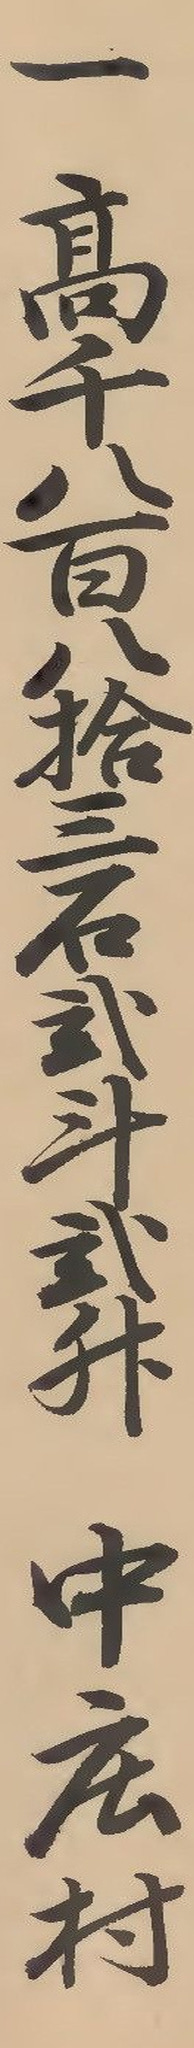一高千八百八拾三石弐斗弐升中庄村
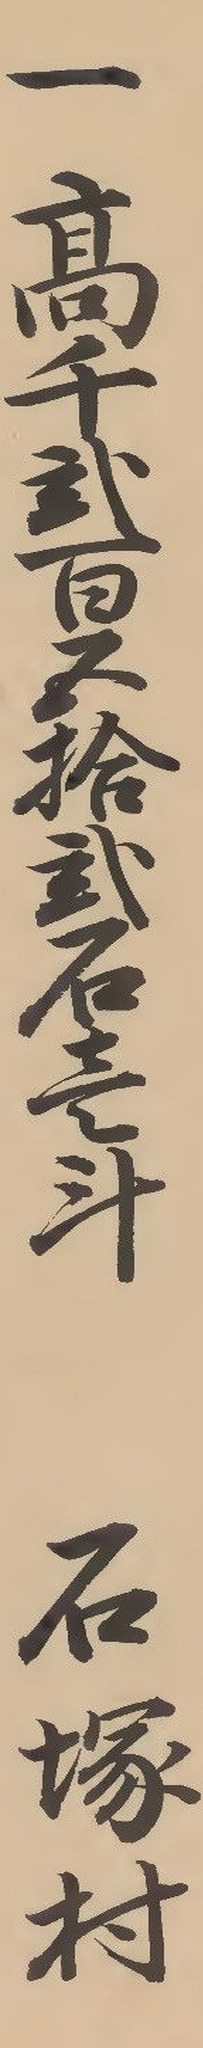一高千弐百五拾弐石壱斗石塚村
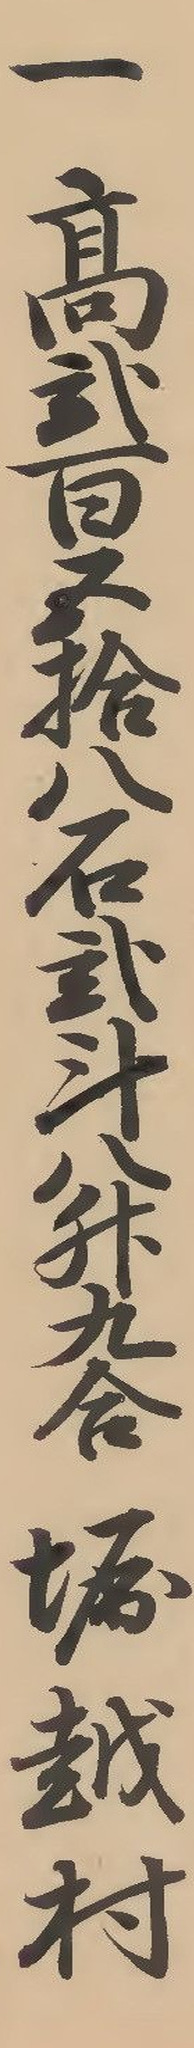一高弐百五拾八石弐斗八升九合堀越村

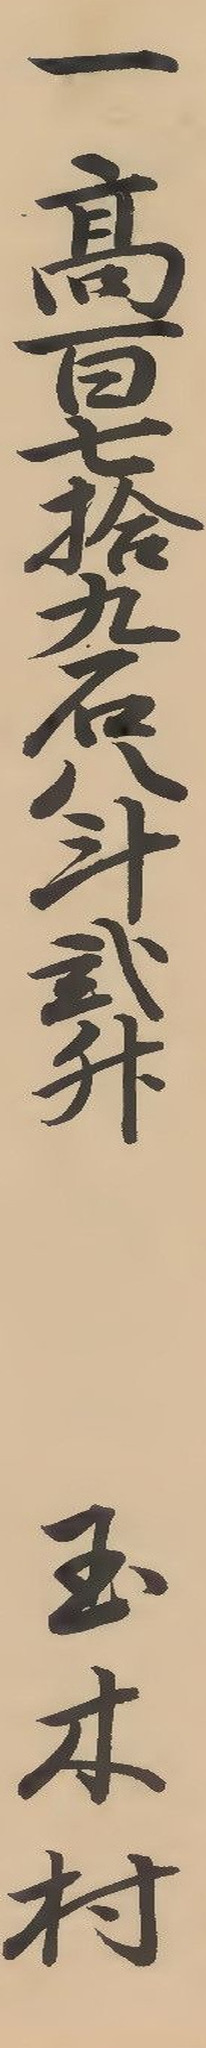一高百七拾九石八斗弐升玉木村
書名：越前国郷帳
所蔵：国立公文書館 National Archives of Japan
